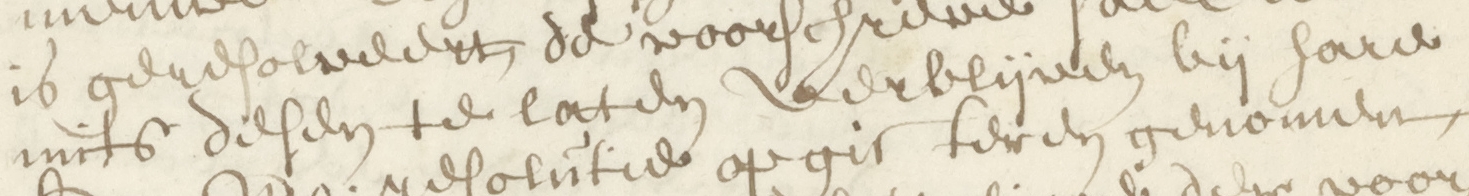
mits desen te laten verblijven bij hare
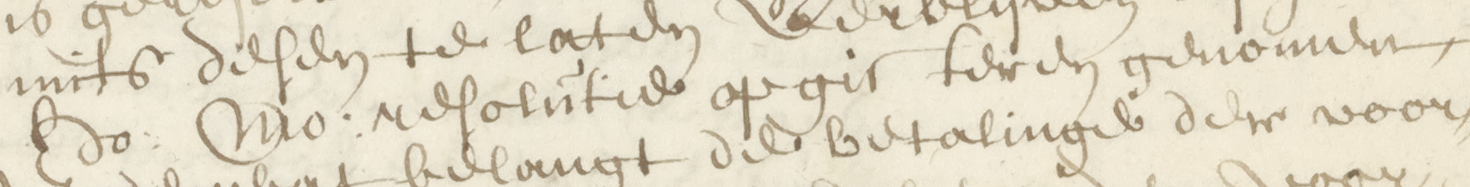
Ho:Mo: resolutie op gisteren genomen.
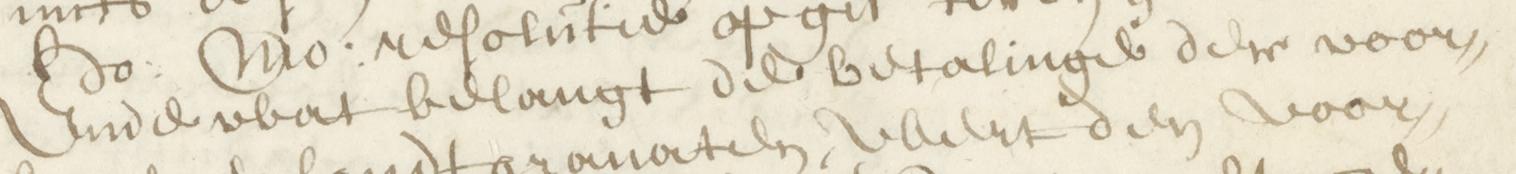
Ende wat belangt de betalinge der voor,,
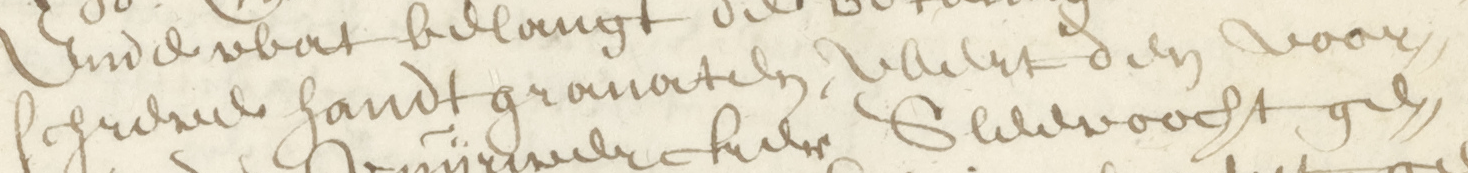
schreve handtgranaten, wert den voor,,
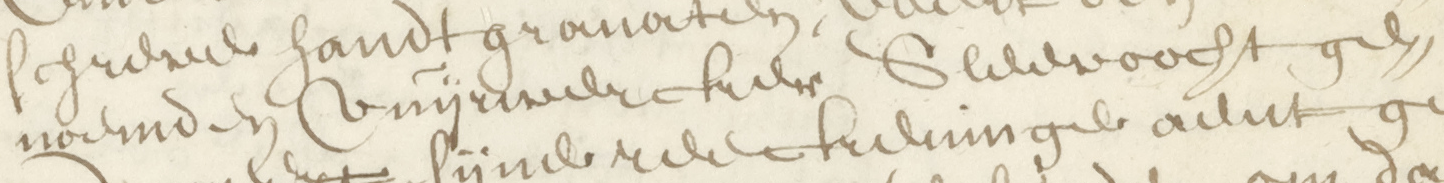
noemden vuijrwercker Sleevoocht ge,,
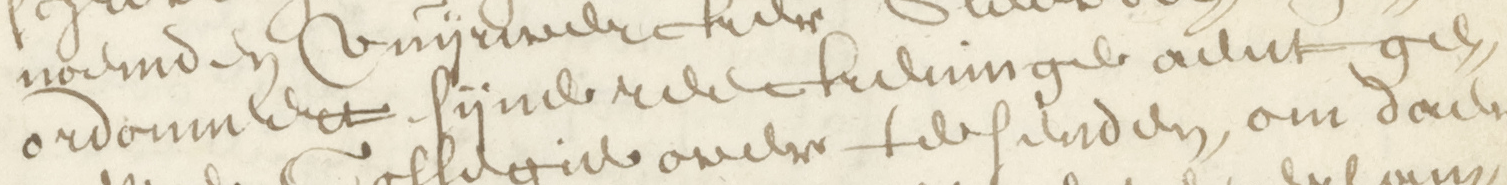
ordonneert sijne reeckeninge aent ge,,
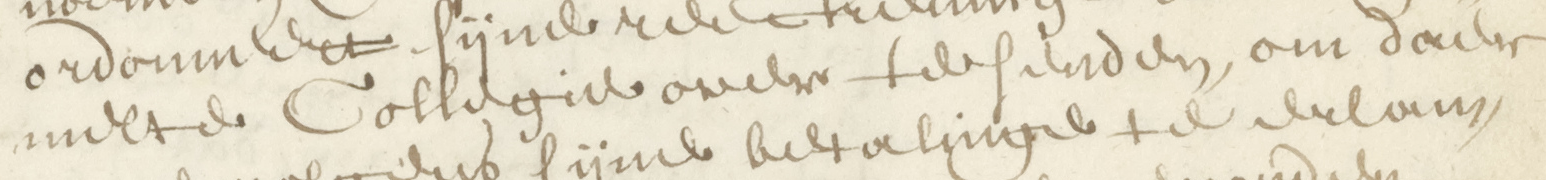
melte Collegie over te senden, om daer
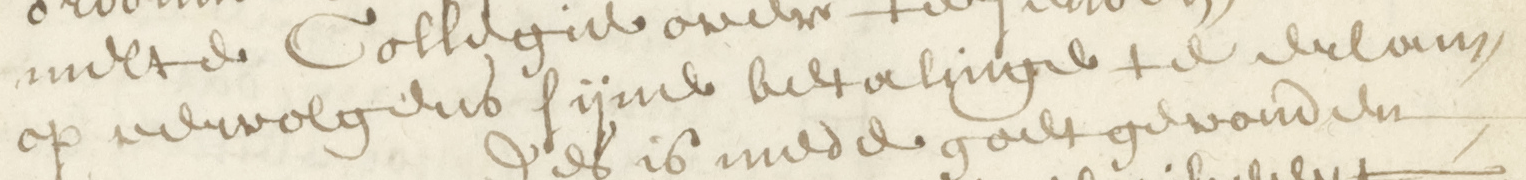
op vervolgens sijne betalinge te erlan„
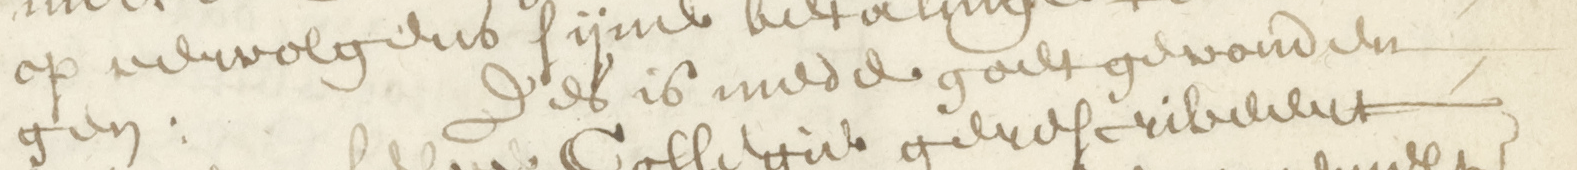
gen: Des is mede goetgevonden,
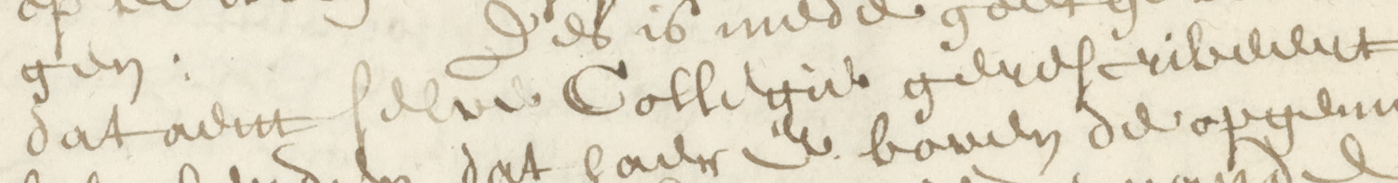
dat aent selve Collegie gerescribeert
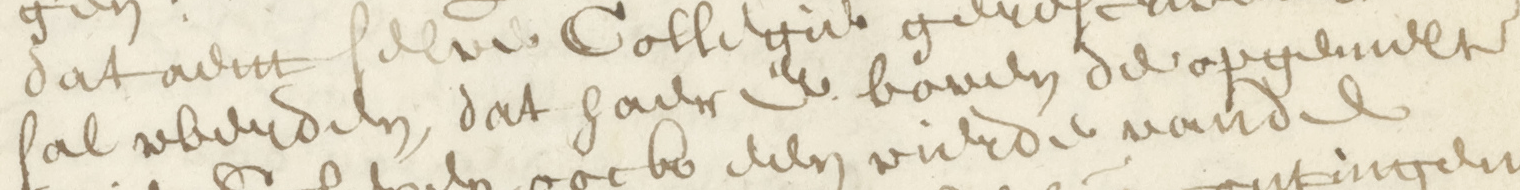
sal werden, dat haer E. boven de opgemelte
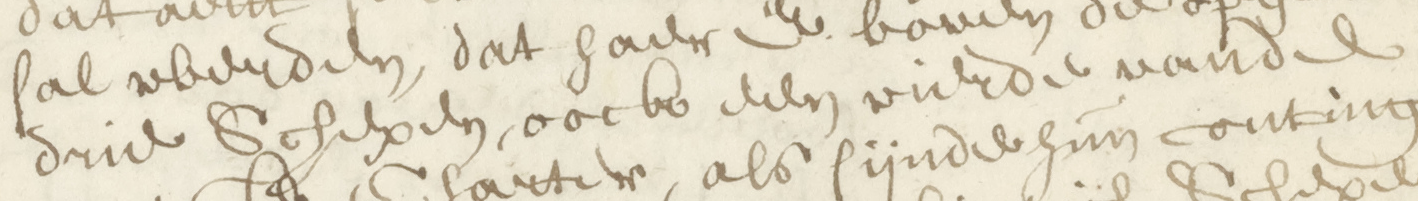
drie Schepen, oock een vierde vande
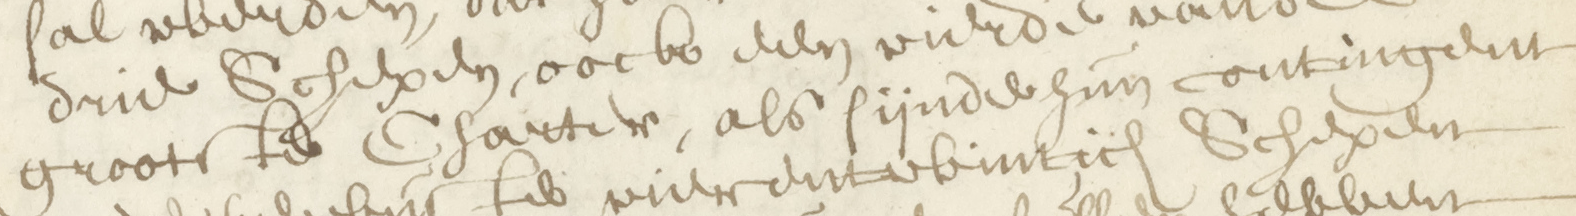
grootste Charter, als sijnde hun contingent
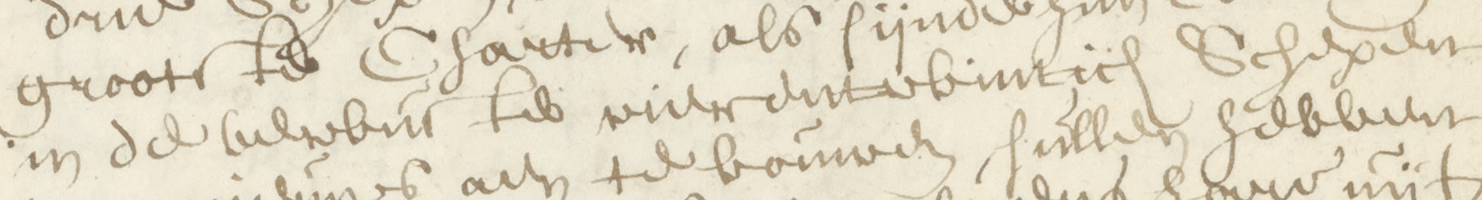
in de bewuste vierentwintich Schepen
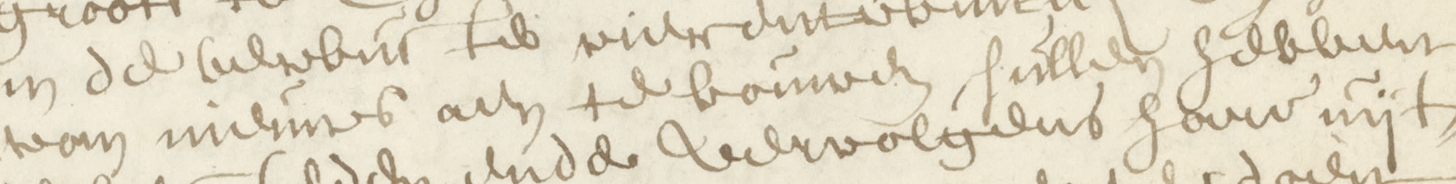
van nieuws aen te bouwen, sullen hebben
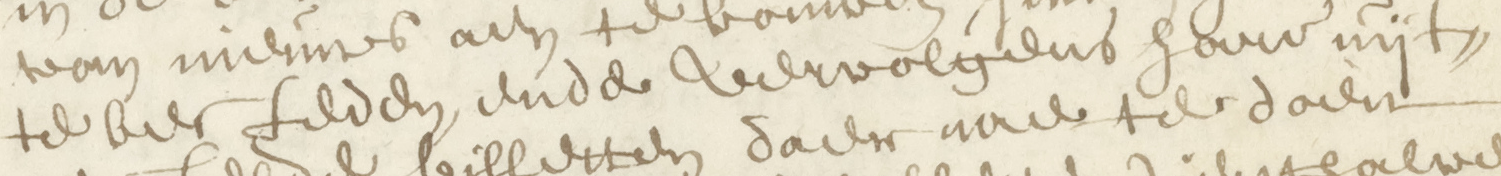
te besteden, ende vervolgens hare uijt„
